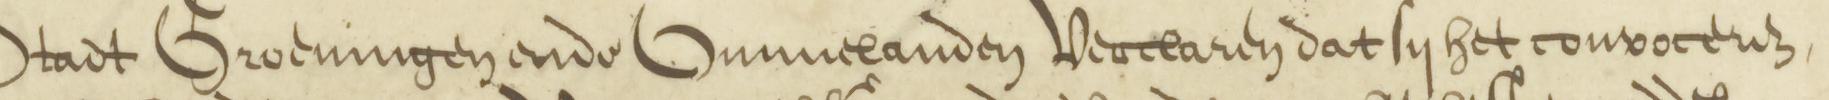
Stadt Groeningen ende Ommelanden Verclaren dat sy het convoceren,
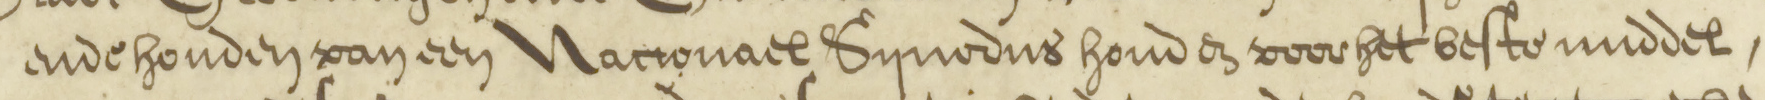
ende houden van een Nacionael Synodus houden voor het beste middel,
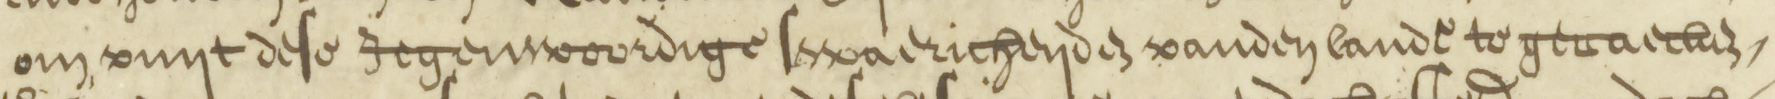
om vuyt dese Jegenwoordige swaericheyden vanden lande te geraecken,
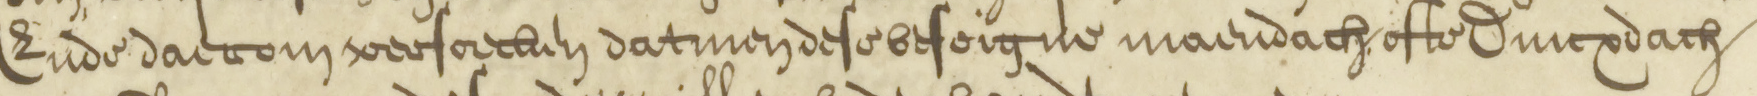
Ende daecom versoecken dat men dese besoigne maendach ofte Dincxdach
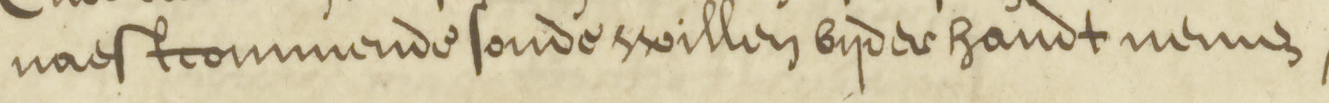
naestcommende soude willen byder handt nemen.
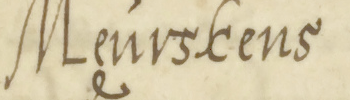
Meurskens
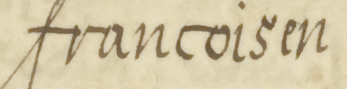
francoisen
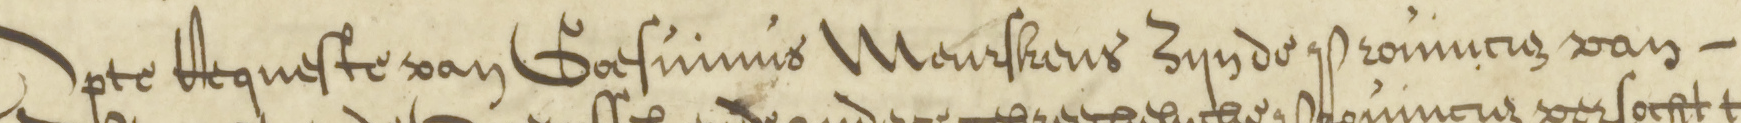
Opte Requeste van Goesuinus Meurskens zyn de Prouincien van —
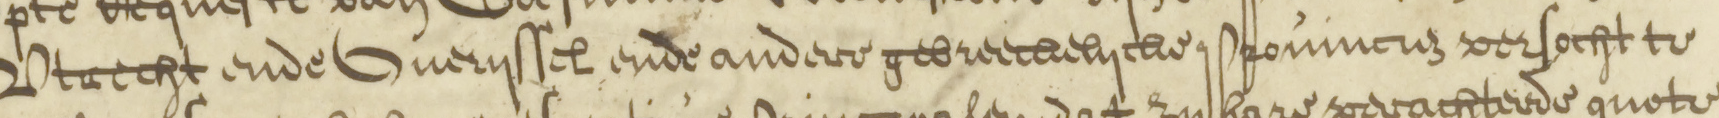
Utrecht ende Oueryssel ende andere gebreeckelycke Prouincien versocht te
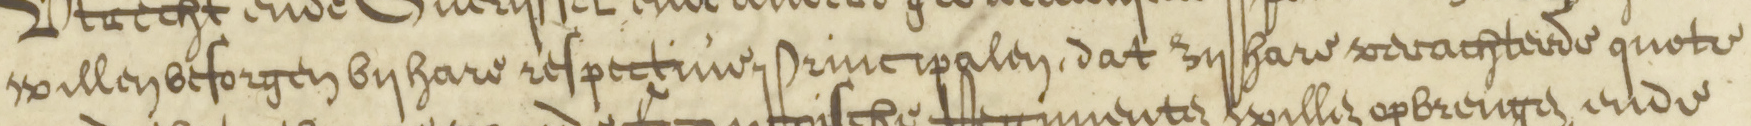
willen besorgen by hare respectiue, Principalen, dat zy hare verachterde quote
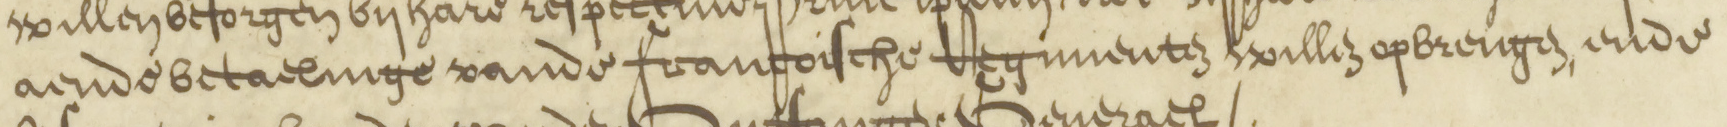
aende betaelinge vande francoische Regimenten willen opbrengen ende
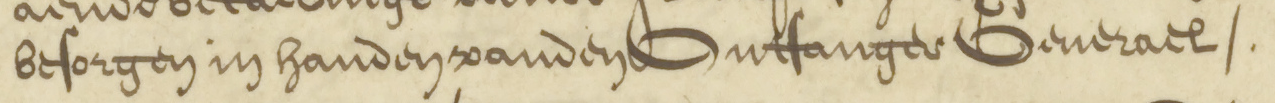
besorgen in handen vanden Ontfanger Generael.
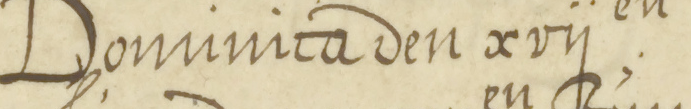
Dominica den xvijen. Junij
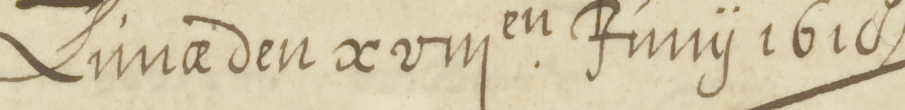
Luna den xviijen. Junij 1618.
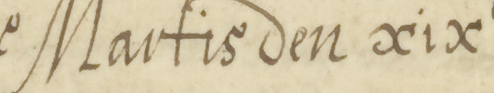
Martis den xixen. Junij 1618.
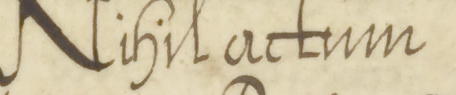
Nihil actum
